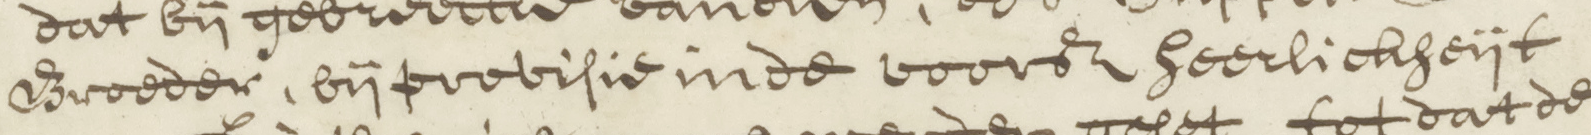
Broeder, bij provisie inde voors heerlickheijt
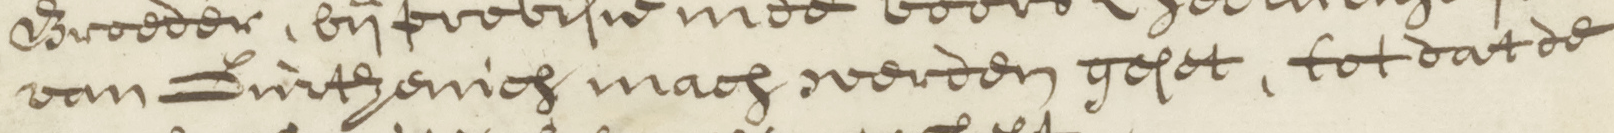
van Gurtzenich mach werden geset, tot dat de
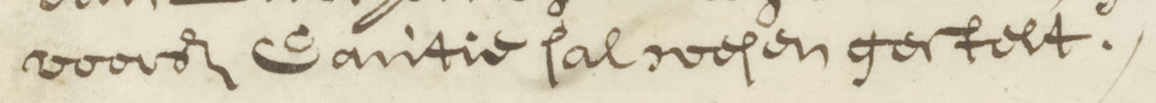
voors Cautie sal wesen gestelt.
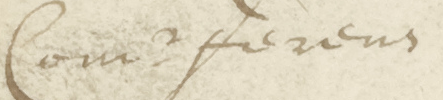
Comr. Ferens
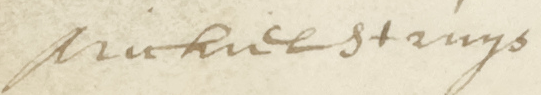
Michiel Struys
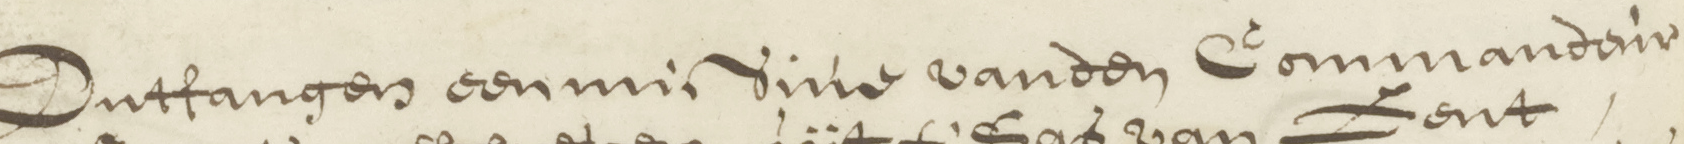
Ontfangen een missiue vanden Commandeur
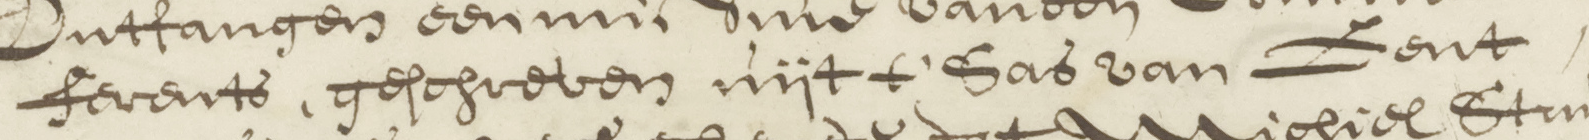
Ferents, geschreven uijt t' Sas van Gent,
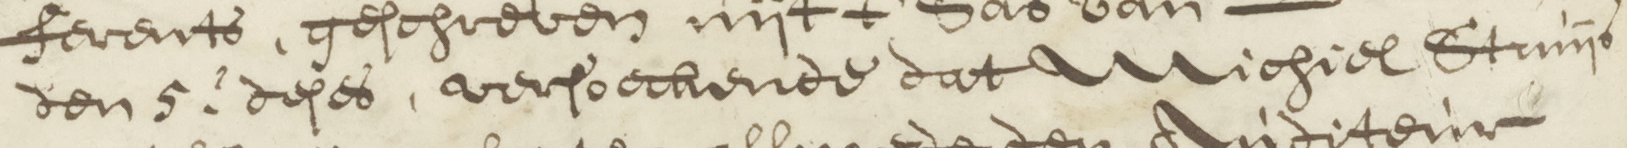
den 5e. deses, versoeckende dat Michiel Struijs
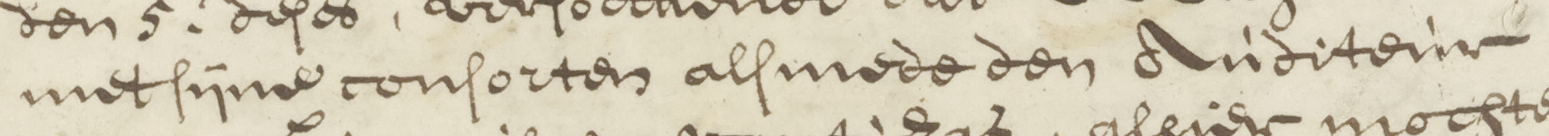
met sijne consorten alsmede den Auditeur
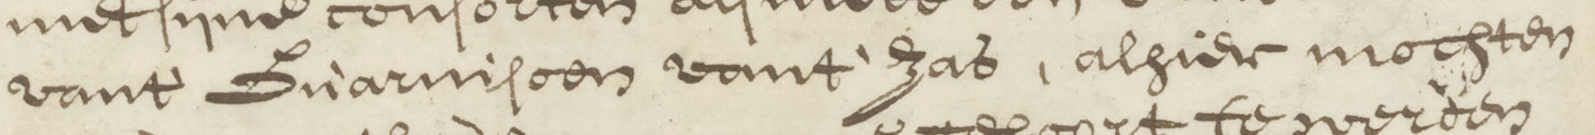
vant' Guarnisoen vant' Zas, alhier mochten
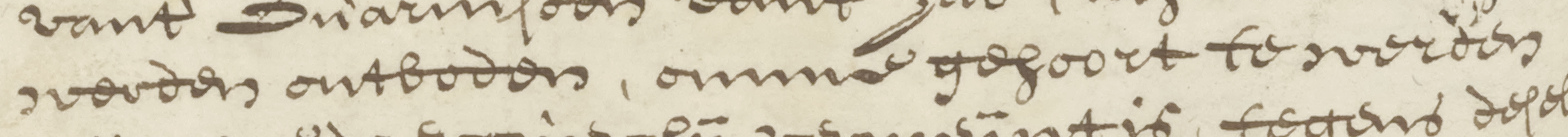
werden ontboden, omme gehoort te werden
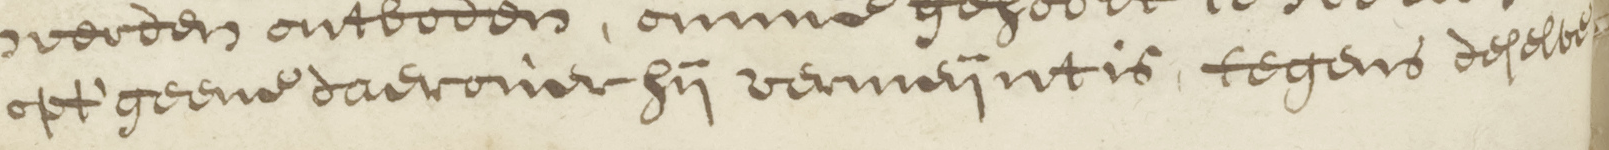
opt' geene daerouer hij vermeijnt is, tegens deselve
